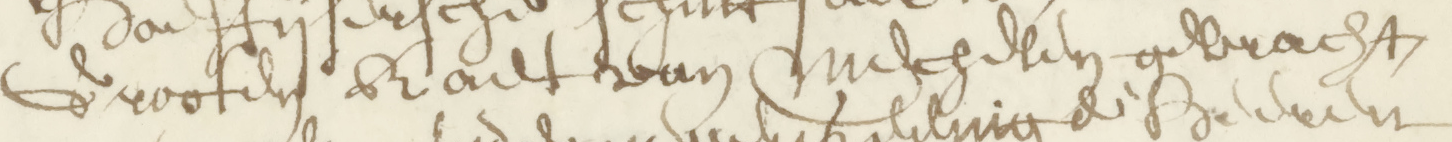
Grooten Raet van Mechelen gebracht,
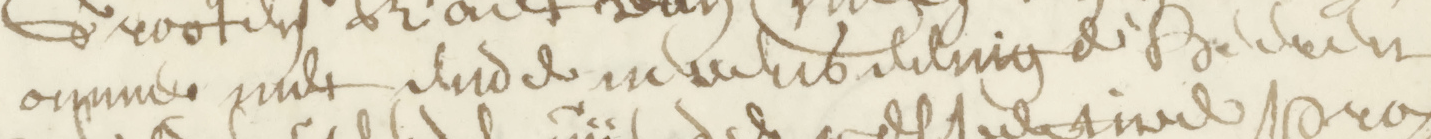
omme niet ende nevens eenige Heeren
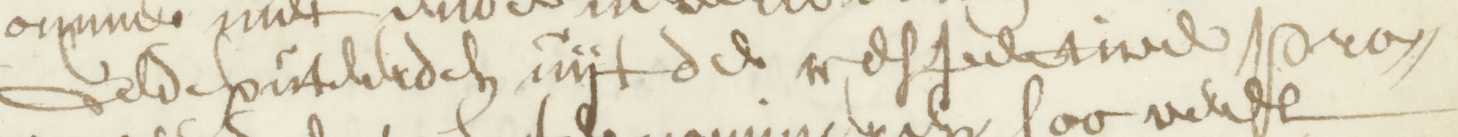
Gedeputeerden uijt de respective Pro,,
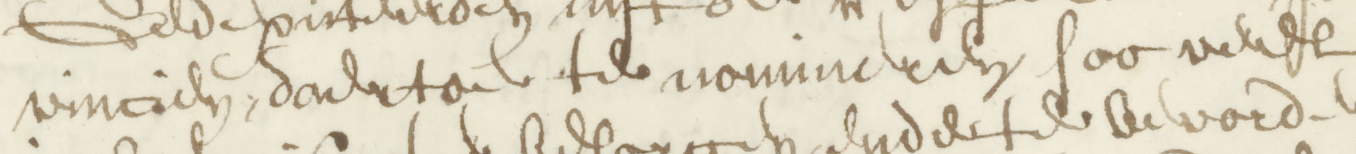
vincien, daertoe te nomineren, soo veel
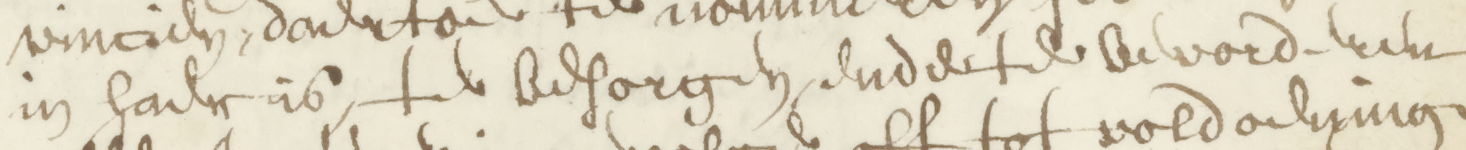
in haer is, te besorgen, ende te bevorderen
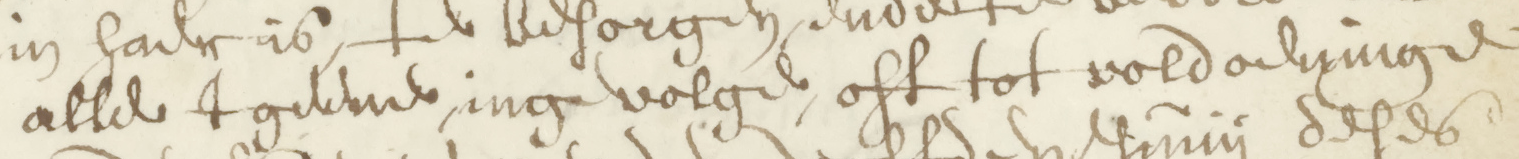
alle 't geene, ingevolge, oft tot voldoeninge
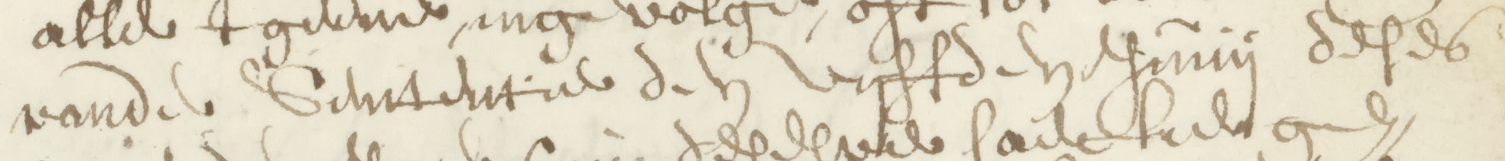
vande Sententie den vijffden Junij deses
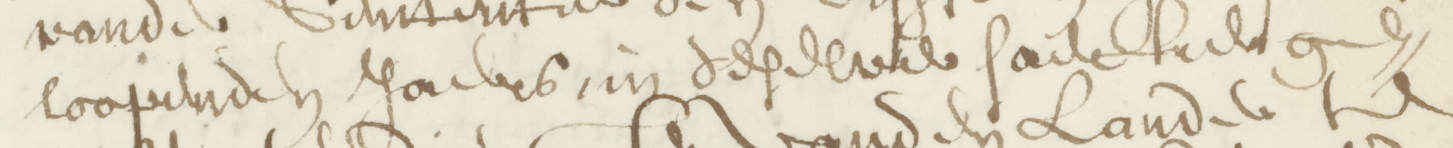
loopenden Jaers, in deselve saecke ge„
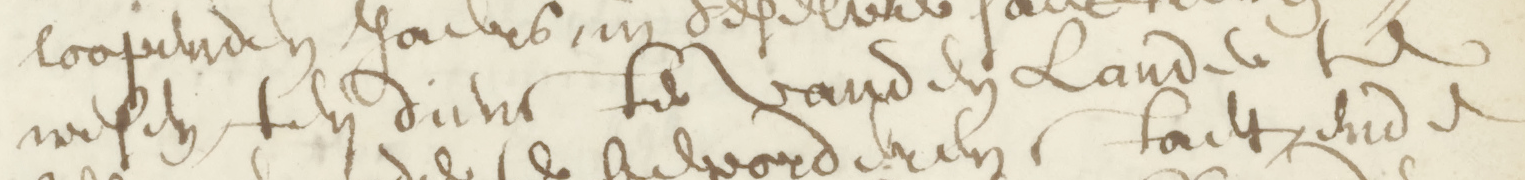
wesen, ten dienste vanden Lande te
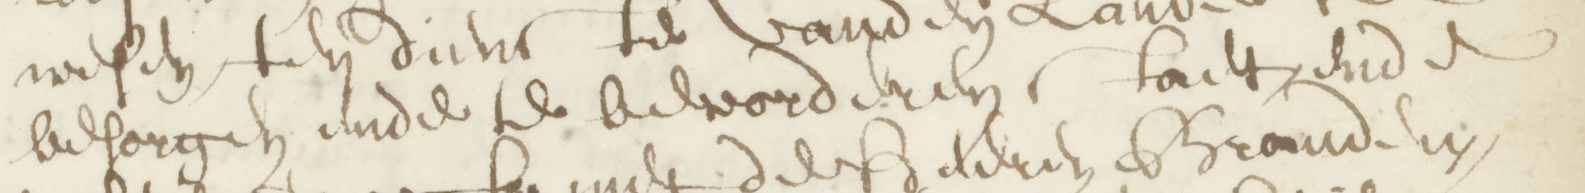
besorgen ende te bevorderen staet ende
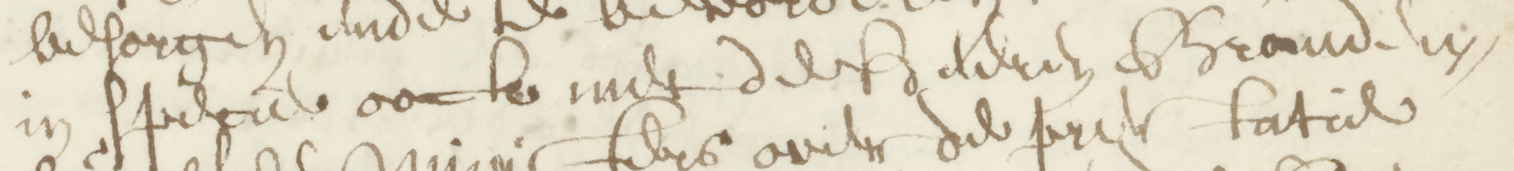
in specie oock met de Heeren Branden„
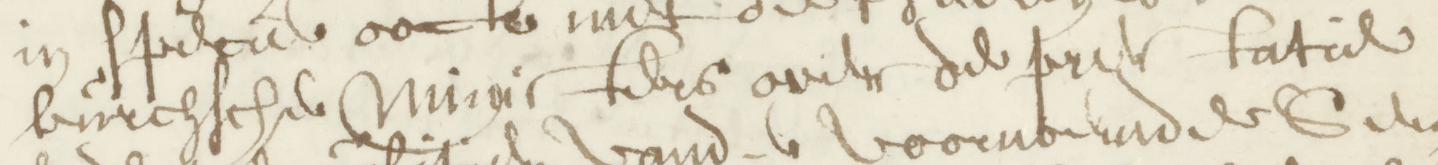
burchsche Ministers over de prestatie
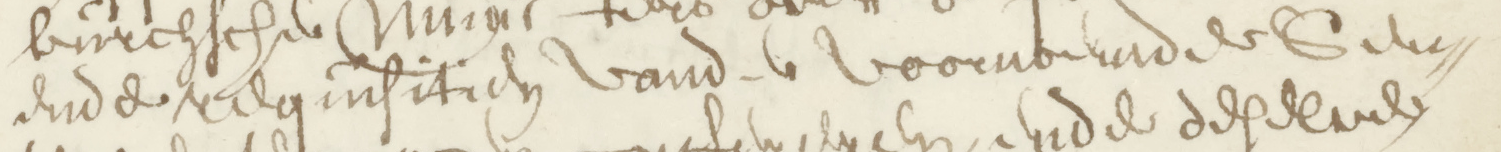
ende requisitien vanden voornoemde Sen,,
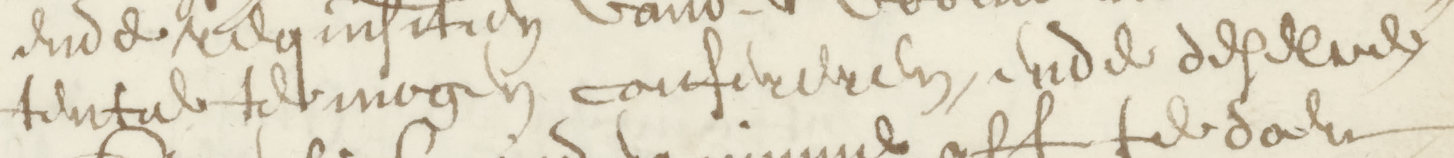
tente te mogen confereren, ende deselve,
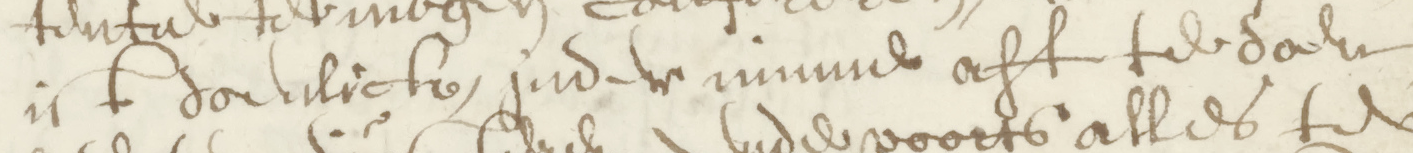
ist doenlick, inder minne aft te doen
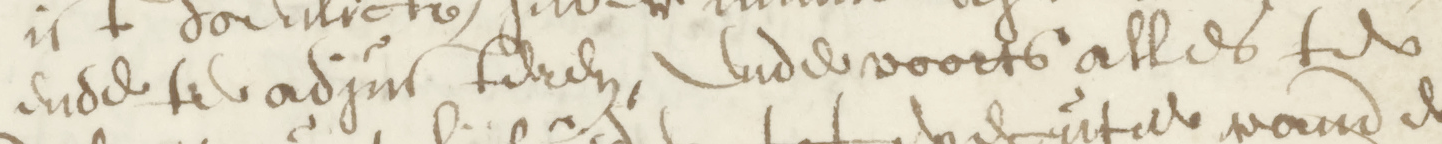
ende te adjusteren, ende voorts alles te
